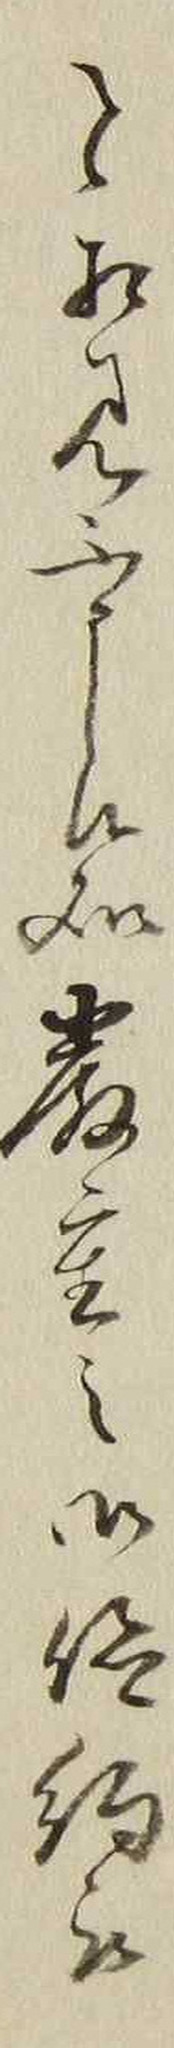と相見不申候処厳重之御倹約被
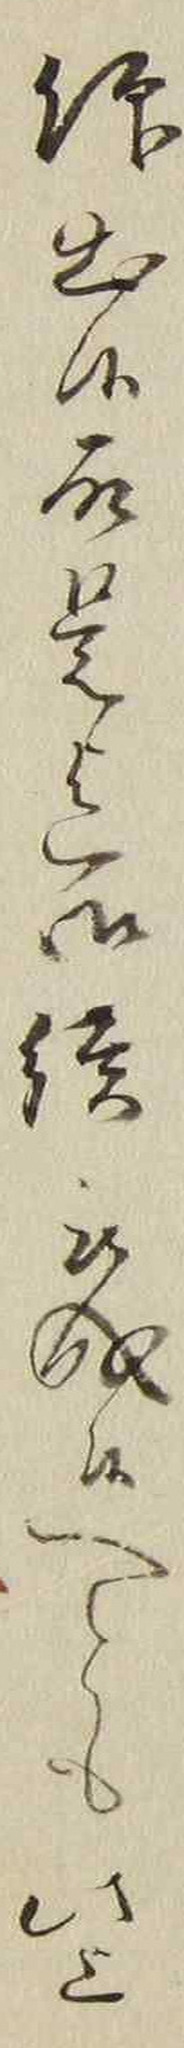仰出候故是迄御続被成候へとも此上
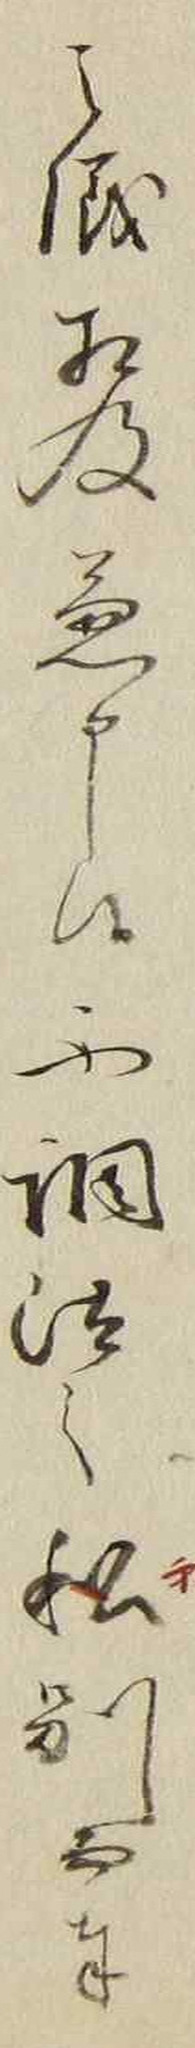之儀相及兼申候不調法之私別而奉

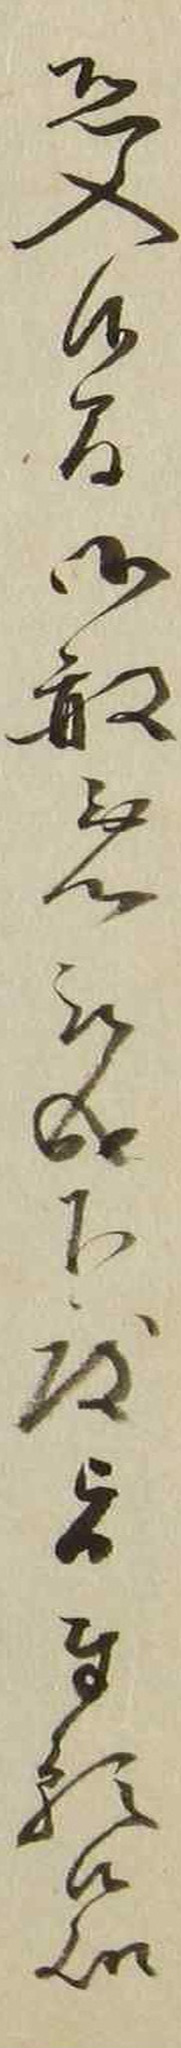恐入候間御赦免被成下度旨奉願候処
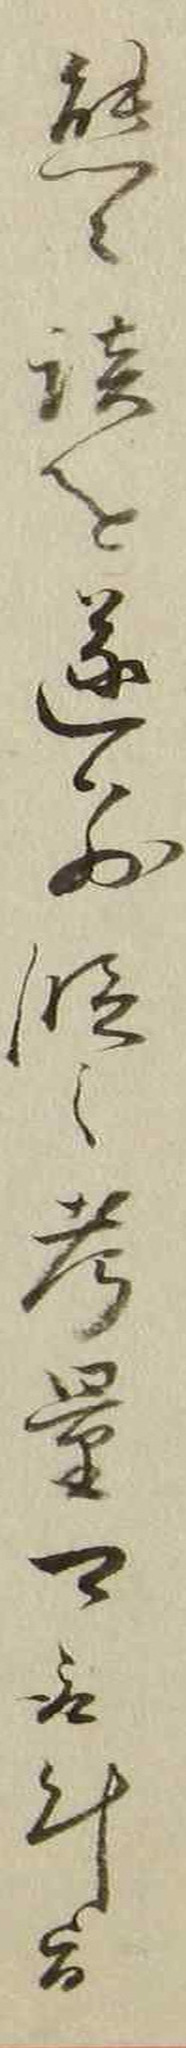態々談を遂別段之考量可取計旨
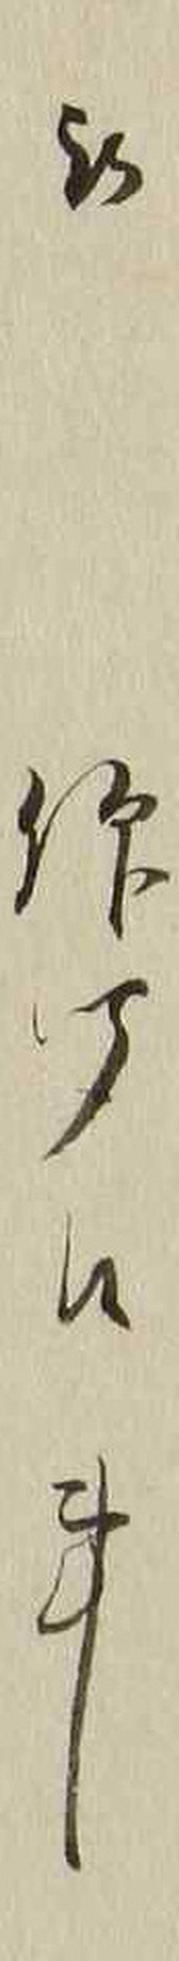被仰付候事
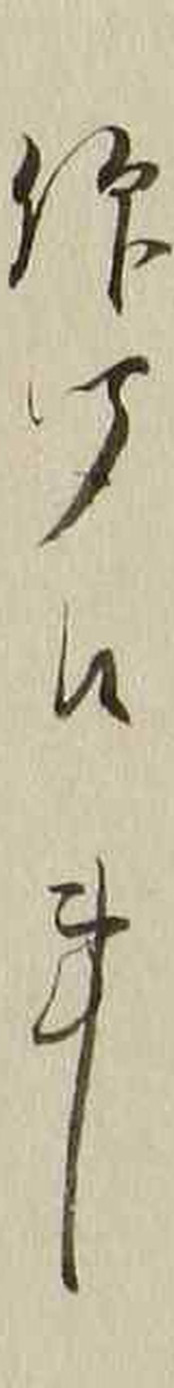仰付候事
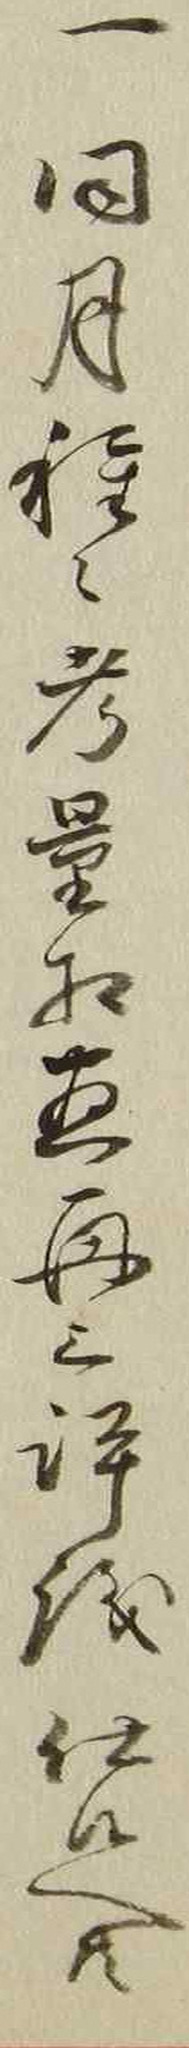一同月種々考量相尽再三評議仕候へ共
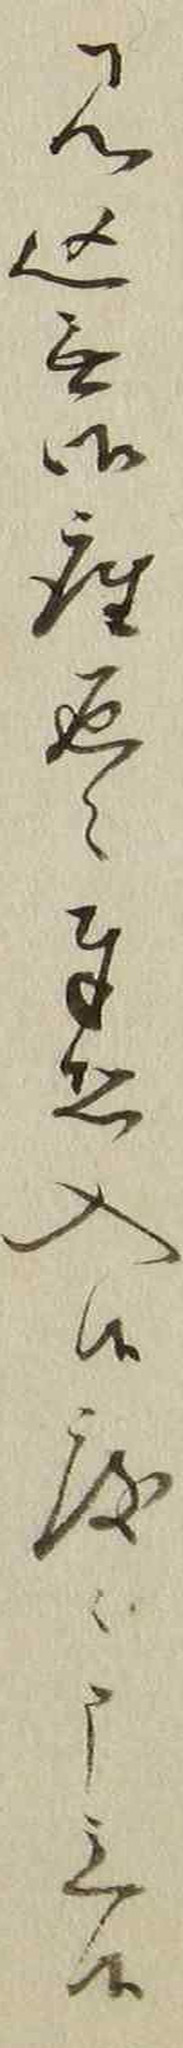見込無御座返々奉恐入候度々申上候
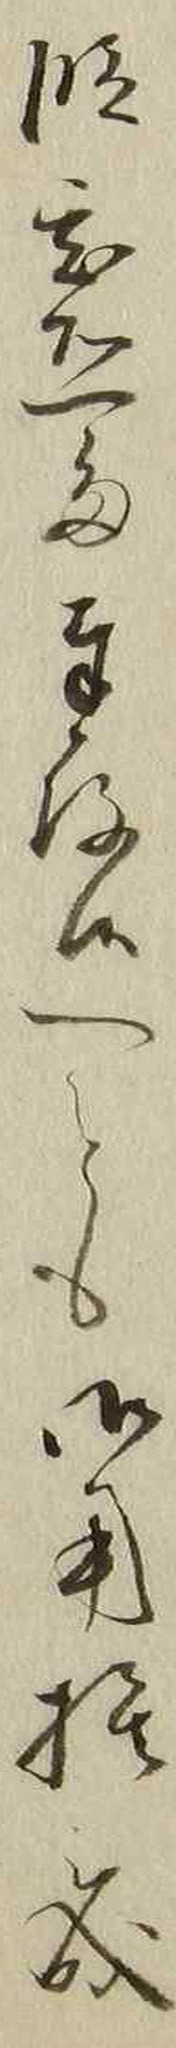段甚恐多奉存候へとも御用捨被成
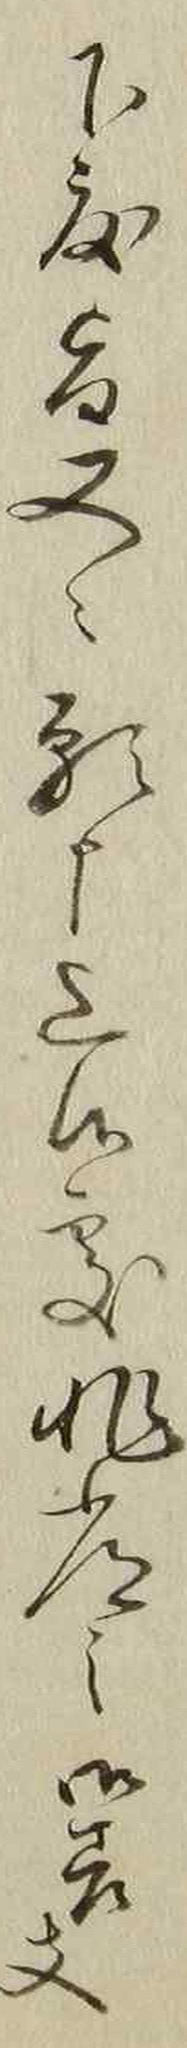下度旨又々願申上候処非常之御差支
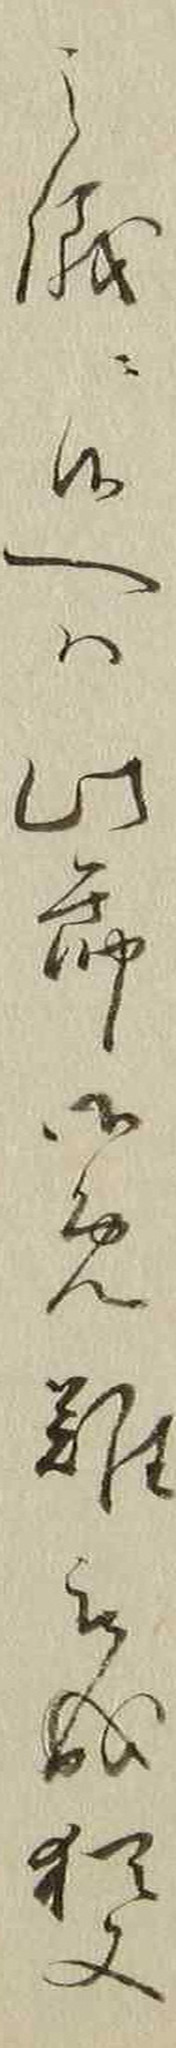之儀ニ候ヘハ此節御免難被成猶又
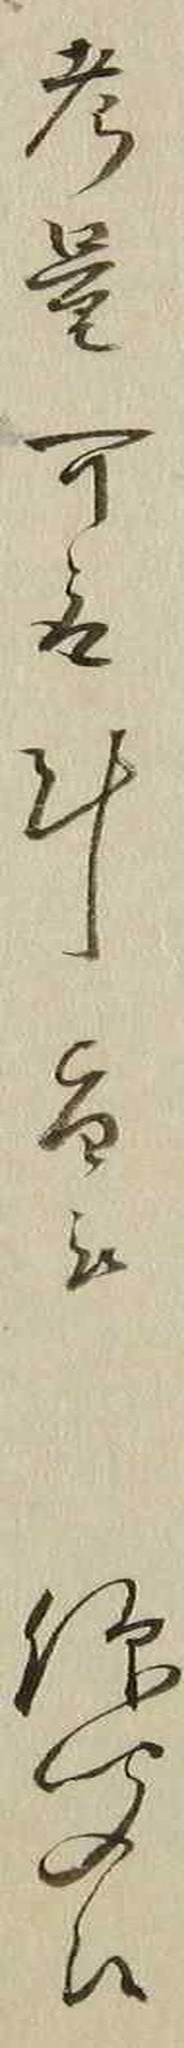考量可取計旨被仰聞候
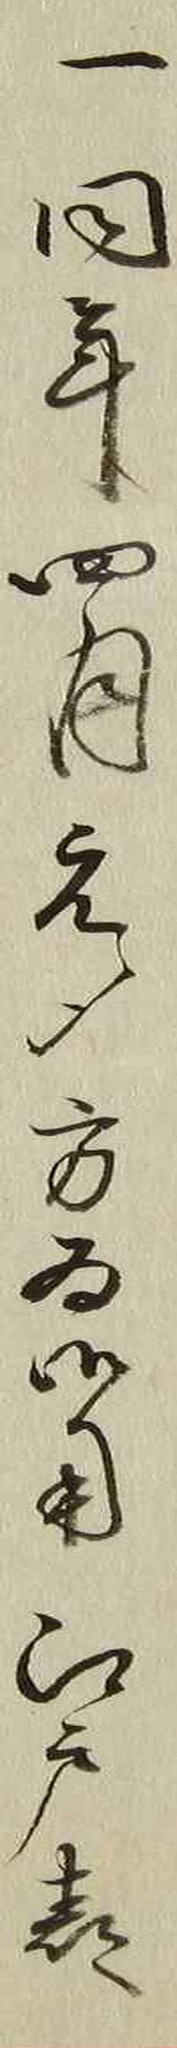一同年四月元〆方為御用江戸表へ
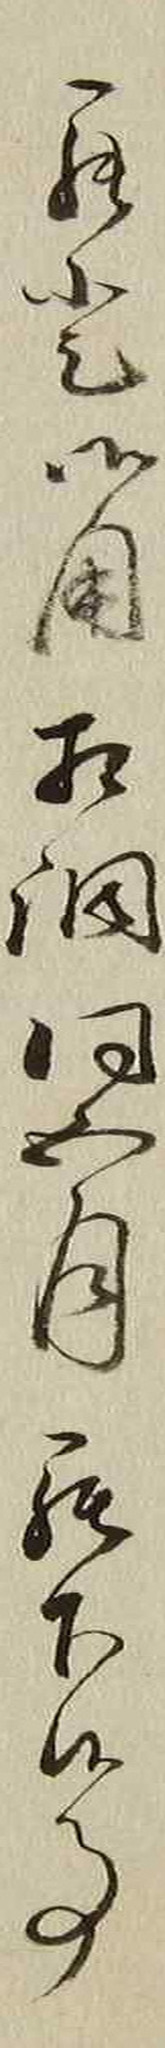罷登御用相調同五月罷下候事
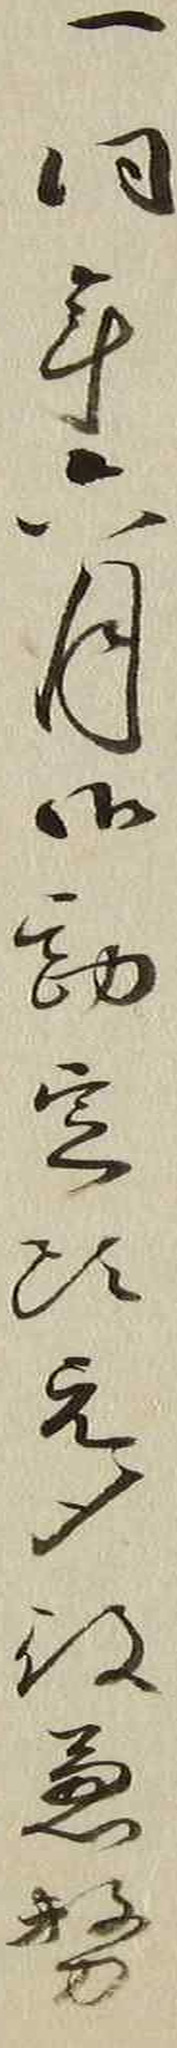一同年六月御勘定頭元〆役兼務
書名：諸士系譜　巻之52　に之部3
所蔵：会津若松市立会津図書館
